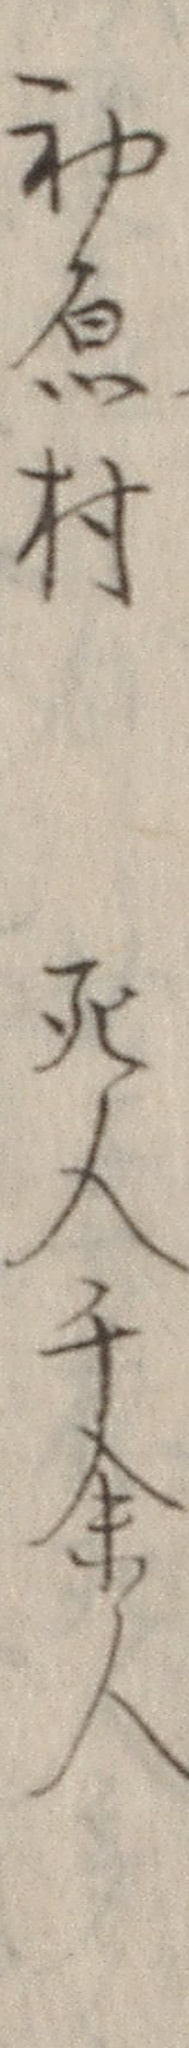初原村死人千余人
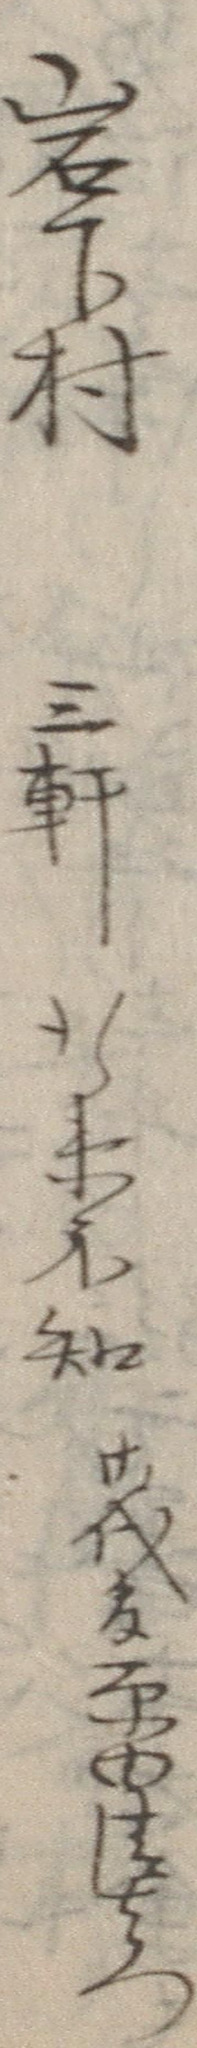岩下村三軒行衛不知御代官原田清右衛門
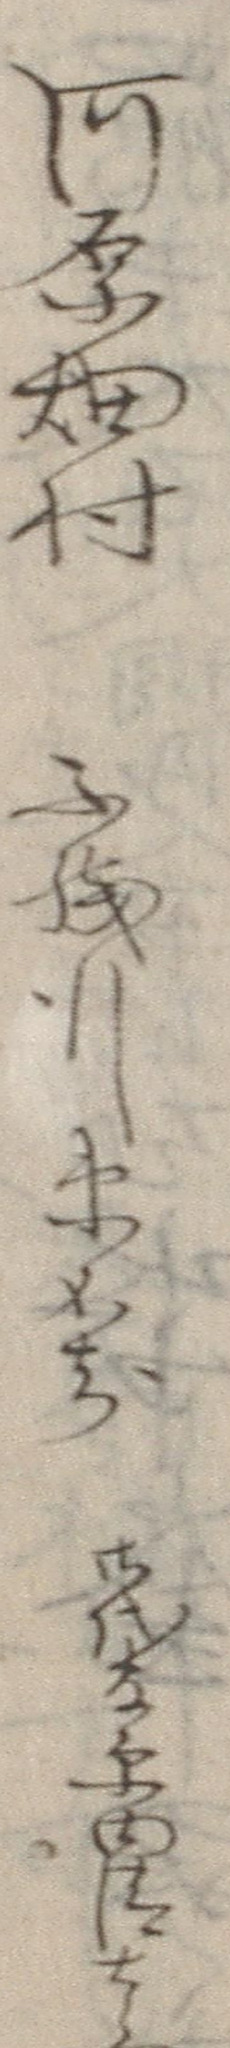河原畑村不行衛不知御代官原田清右衛門
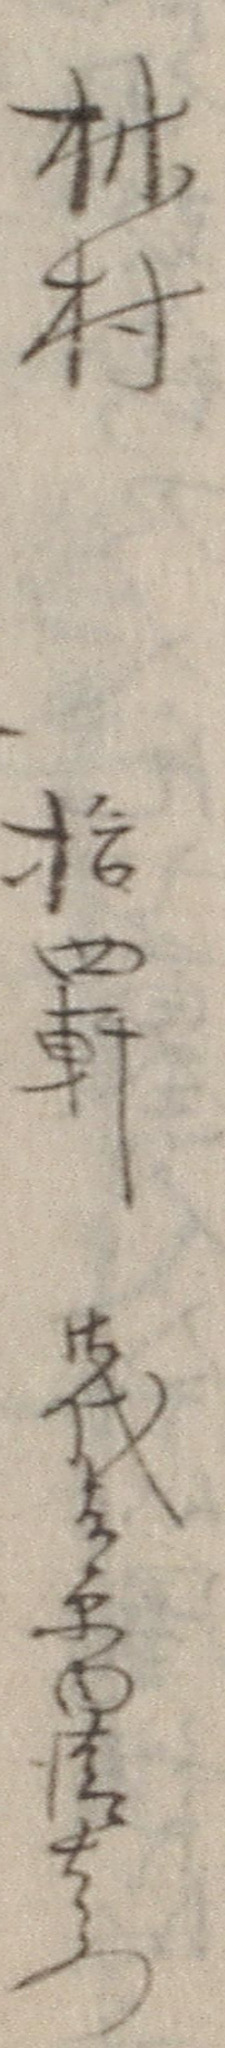林村拾四軒御代官原田清右衛門
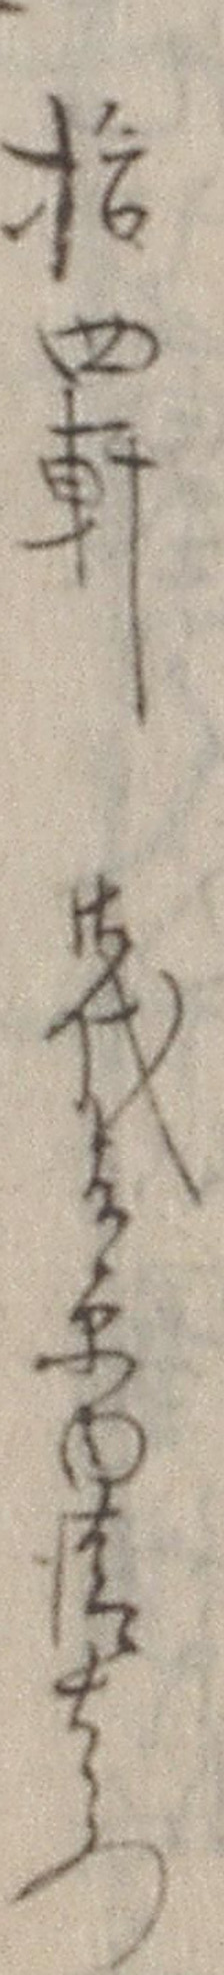林村拾四軒御代官原田清右衛門
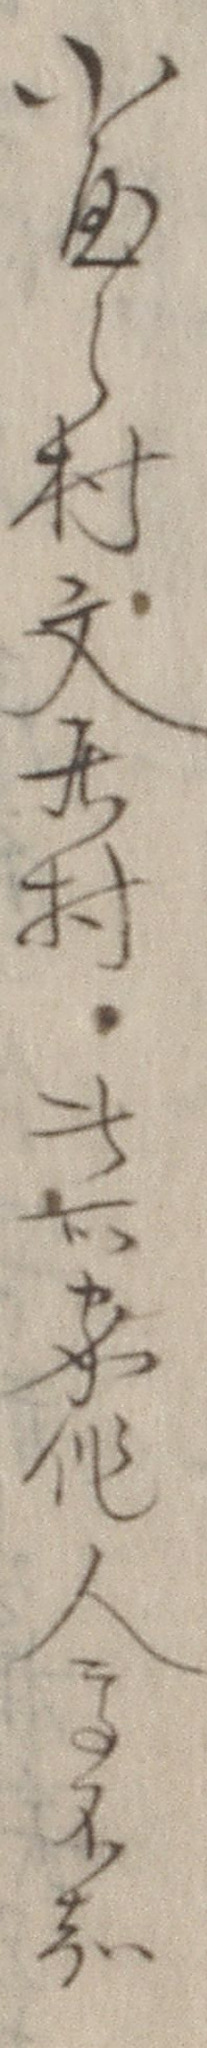小屋之村文居村此所家作人馬不知
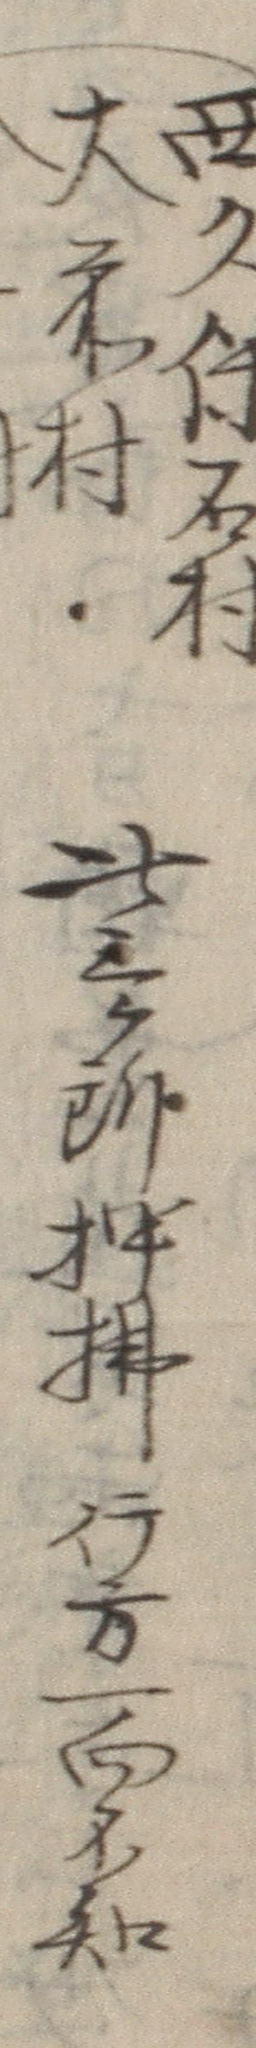西久保石村此三ケ所押払行方一向不知
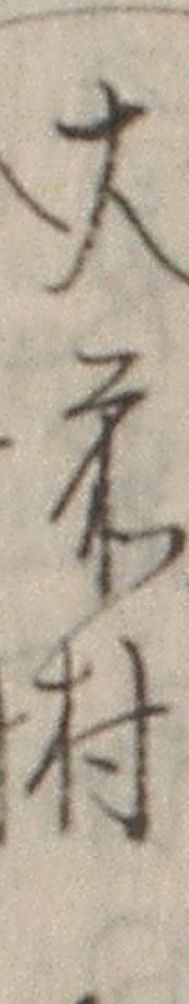大前村
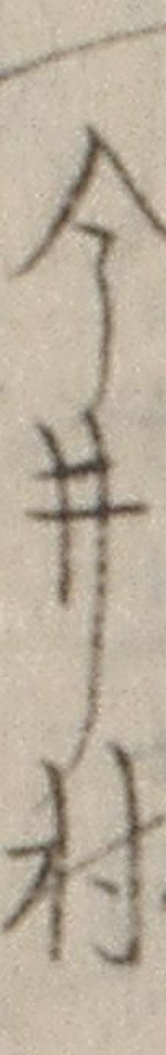今井村
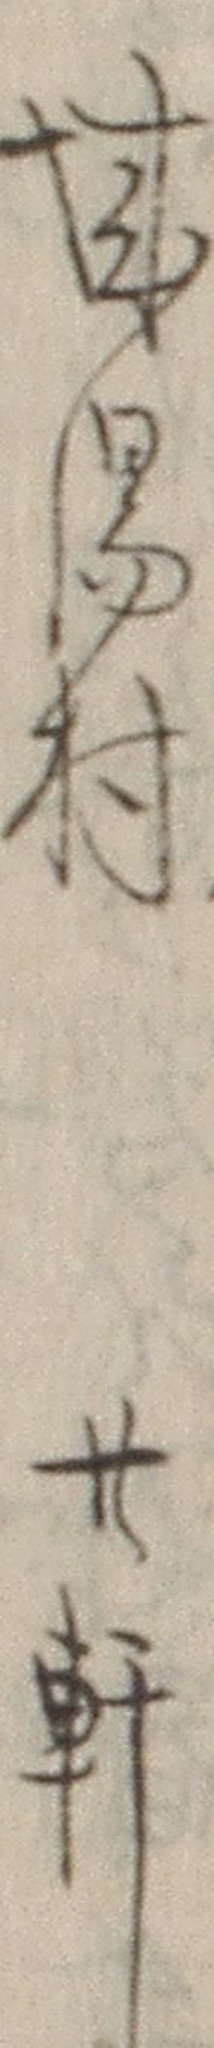城湯村廿軒
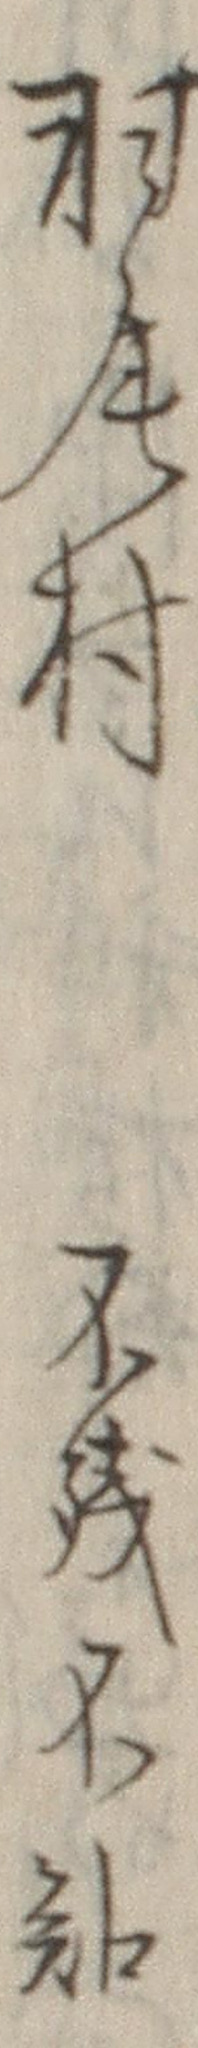羽尾村不残不知
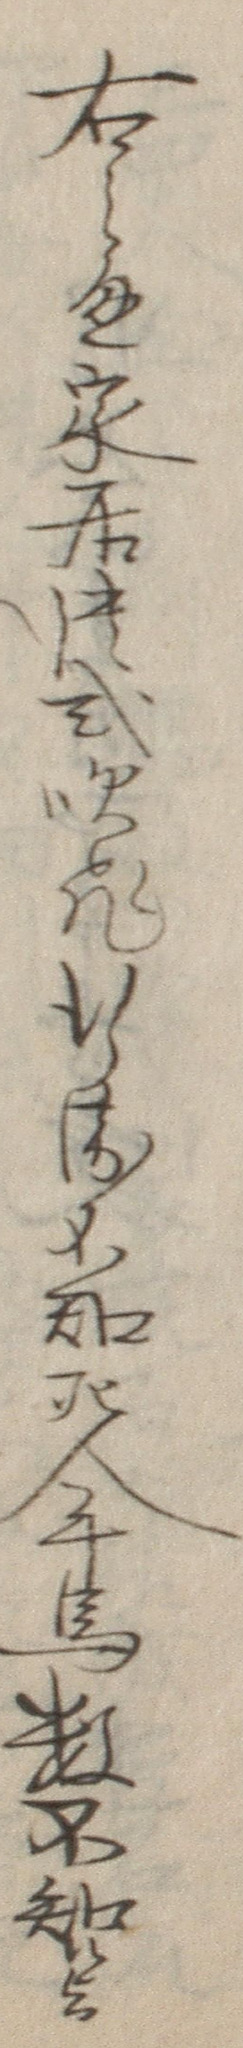右之通家居潰或吹飛行衛不知死人牛馬数不知候旨
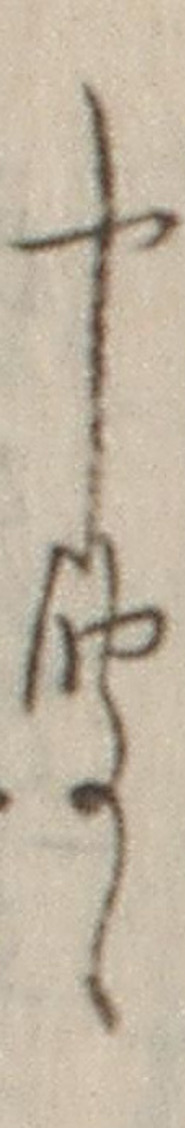申聞候
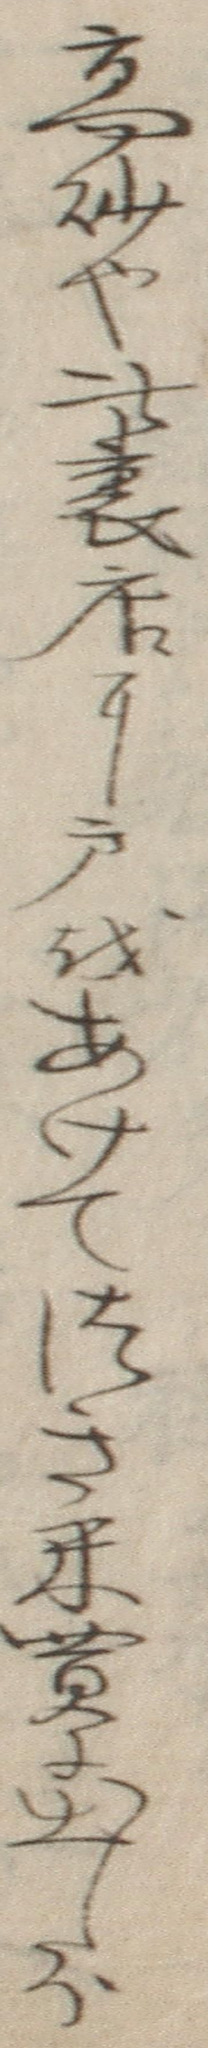高砂や此裏店に戸をあけてつき米買に出しほ
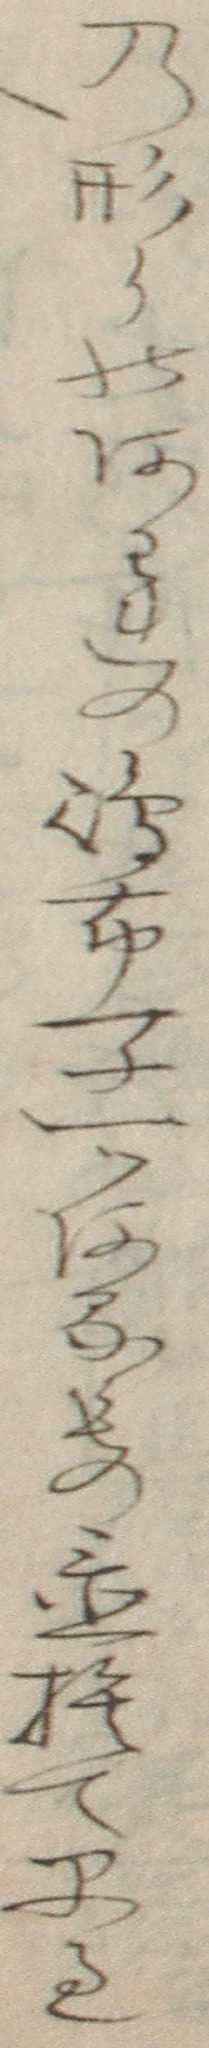の形りの河違の嶋布子一ツあるもの置捨て早過
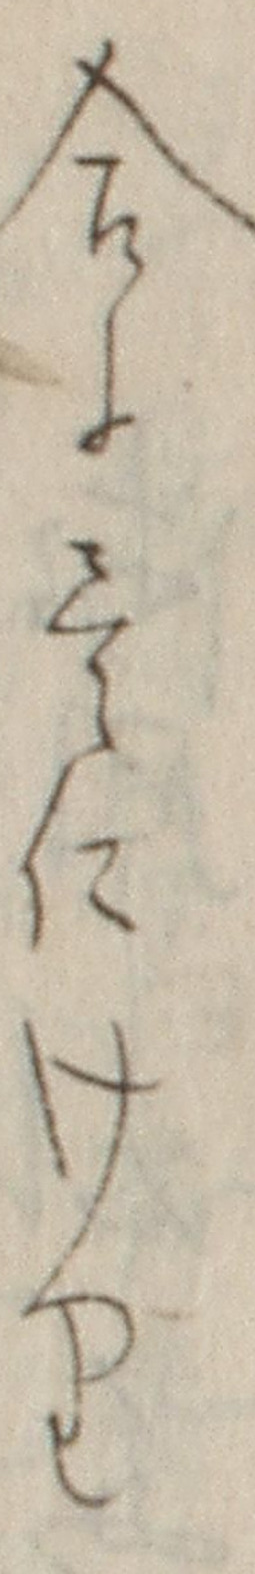合に尽にけり
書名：[諸国災害記録]
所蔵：東京大学地震研究所図書室 Earthquake Research Institute Library, The University of Tokyo, JAPAN
